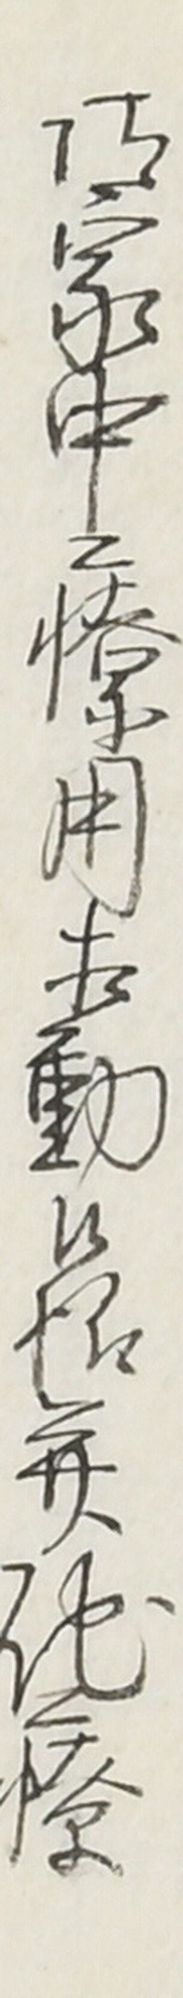御家中療用相勤候趣并他療
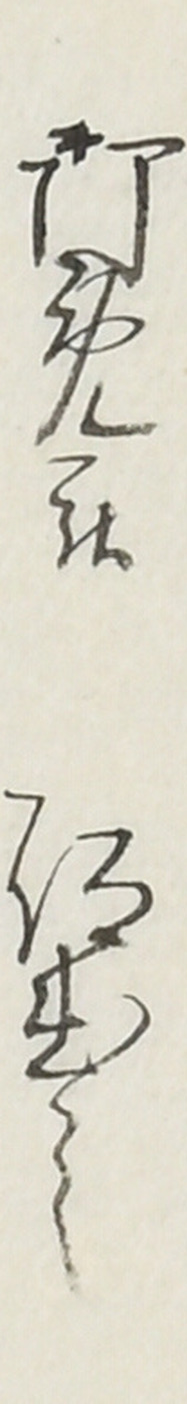御免被仰出之
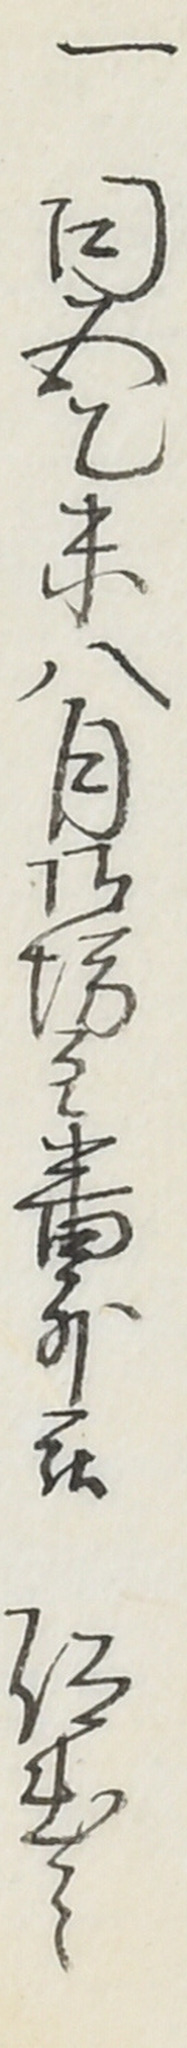一同五乙未八月御坊主番外被仰出之
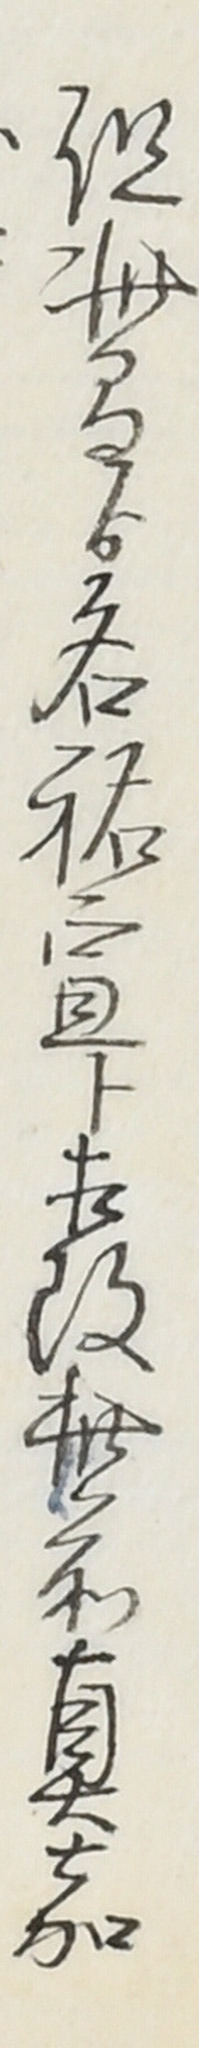但此間ゟ名祐宣ト相改此前真嘉
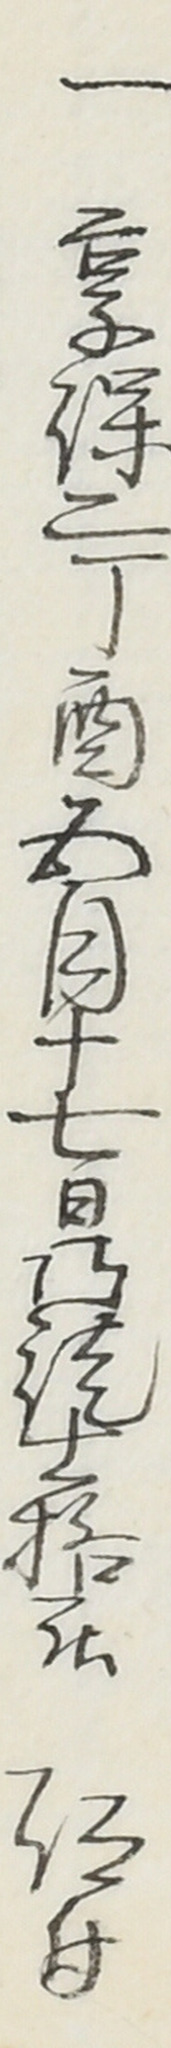一享保二丁酉五月十七日御徒士格被仰付
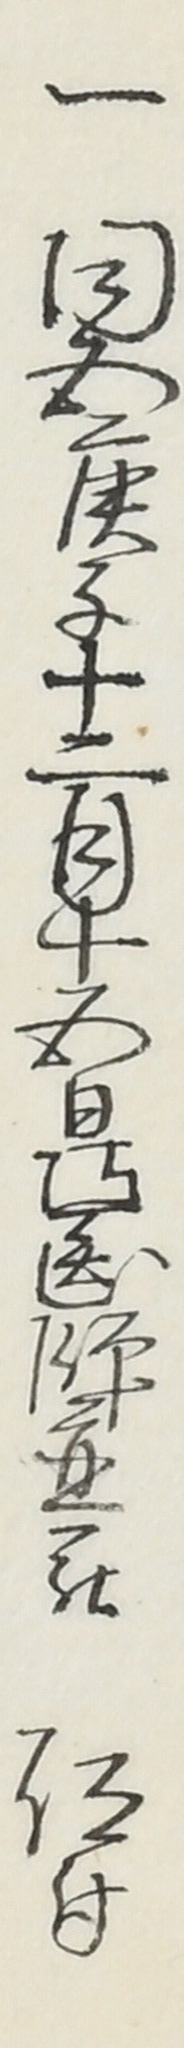一同五庚子十二月十五日御医師並被仰付
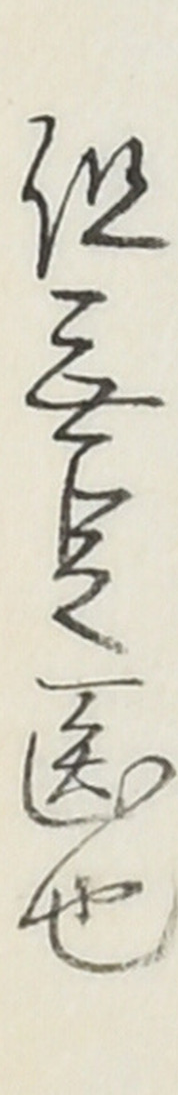但無足医也

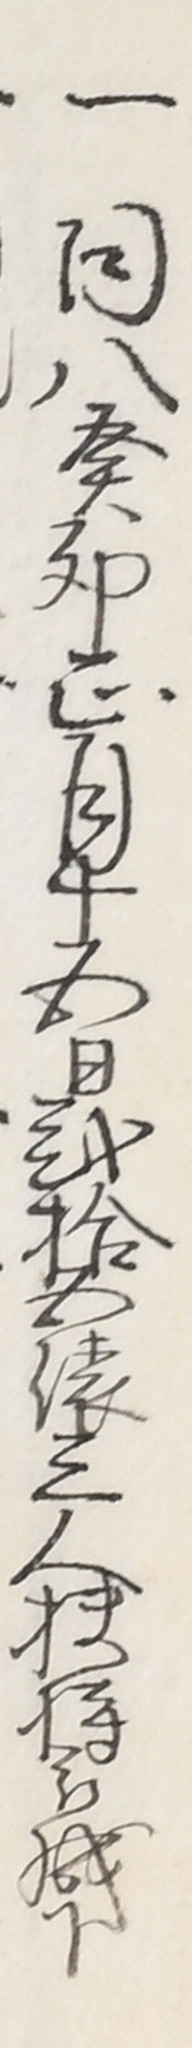一同八癸卯正月十五日弐拾五俵三人扶持被成下
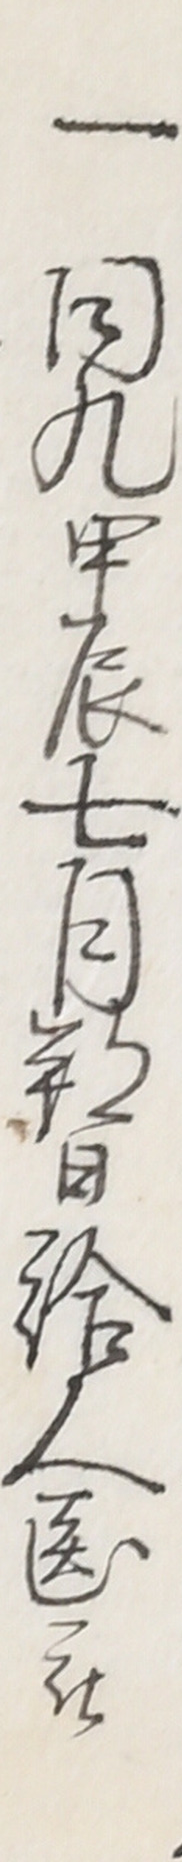一同九甲辰七月朔日給人医被
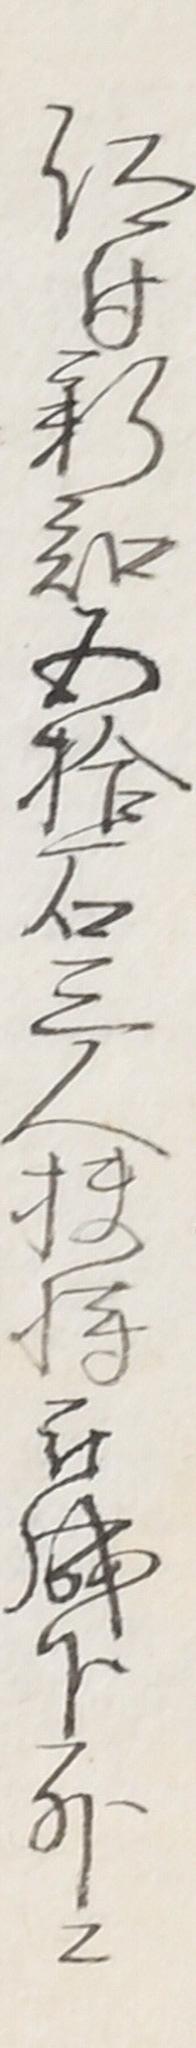仰付新知五拾石三人扶持被成下外ニ
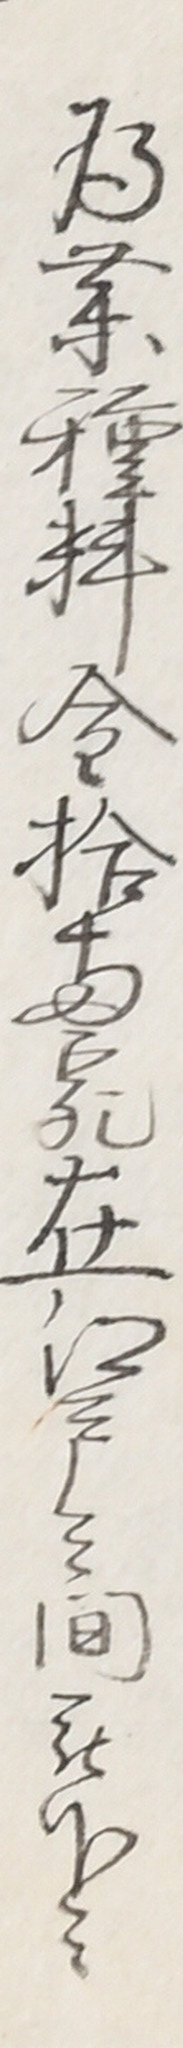為薬種料金拾両宛在江戸之間被下之
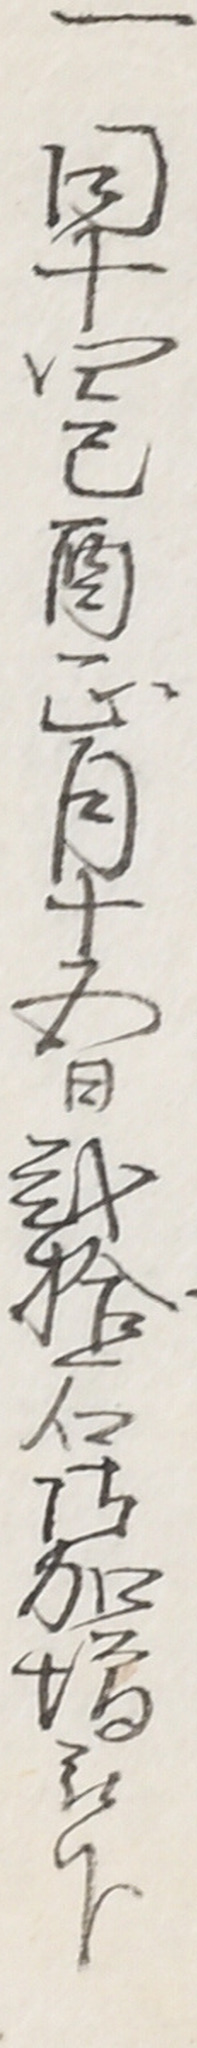一同十四己酉正月十五日弐拾石御加増被下
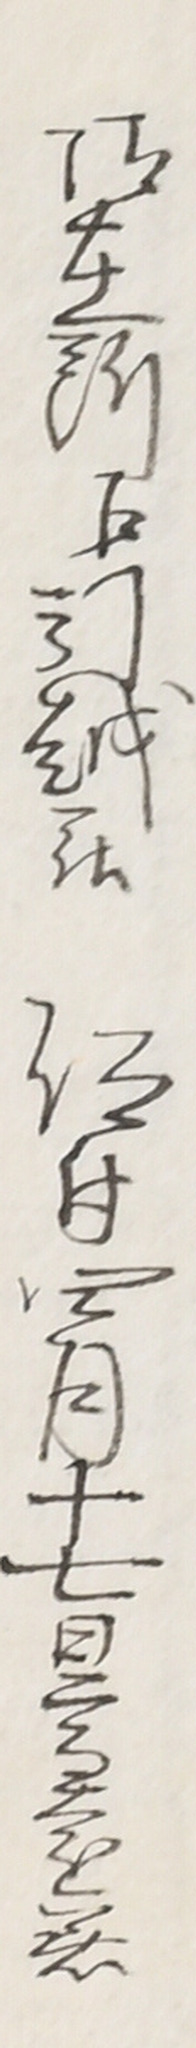御在所江引越被仰付四月十七日高遠着
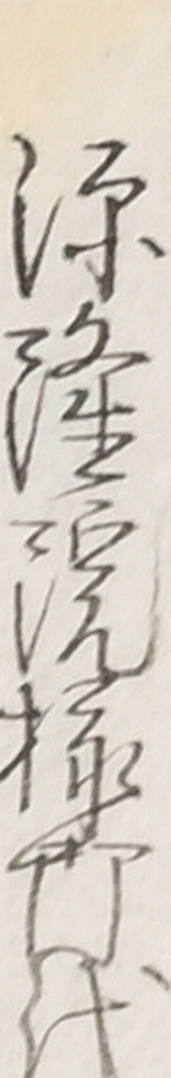源隆院様御代
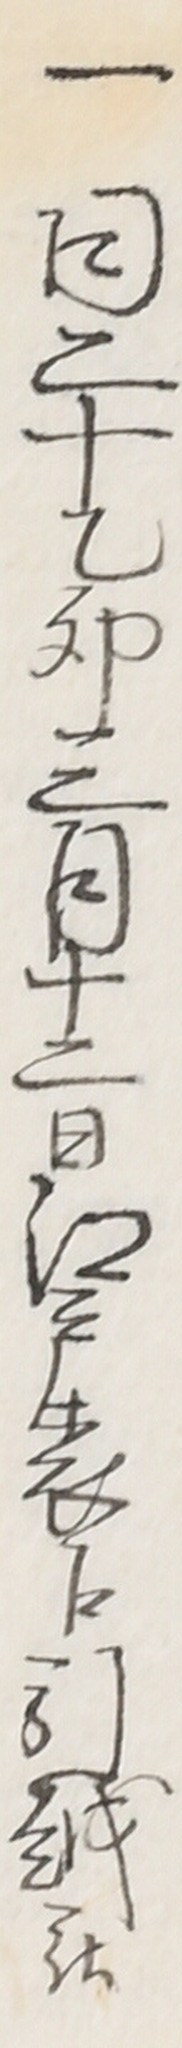一同二十乙卯三月十二日江戸表江引越被
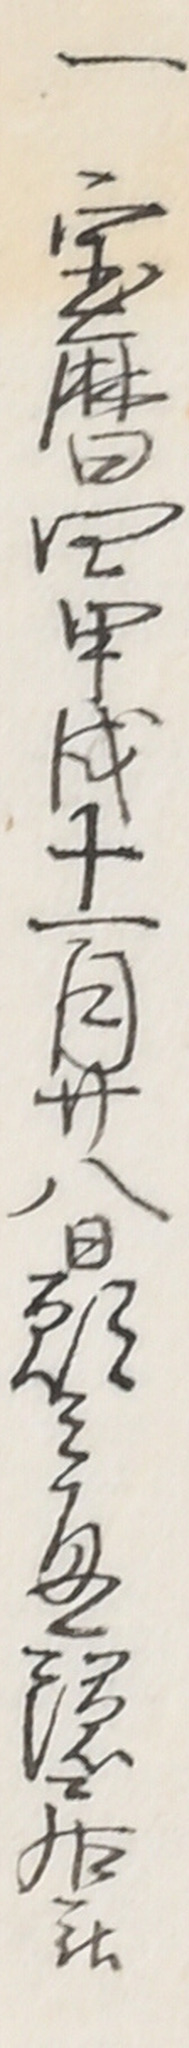一宝暦四甲戌十一月廿八日願之通隠居被
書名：給人諸士勤仕録（七）
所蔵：伊那市立高遠町図書館・合同会社AMANE
